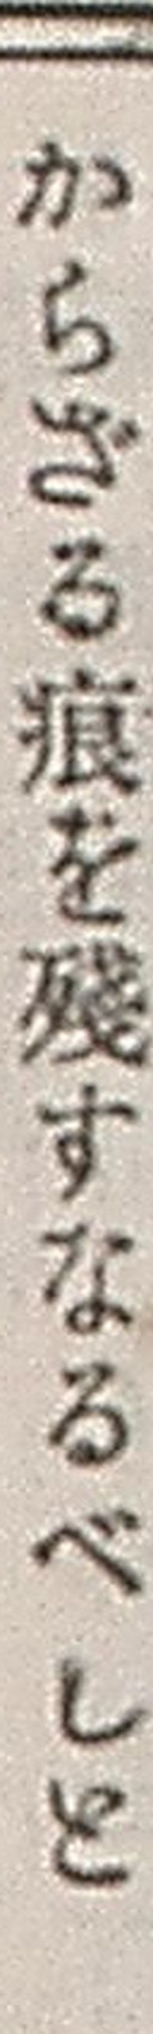からざる痕を残すなるべしと
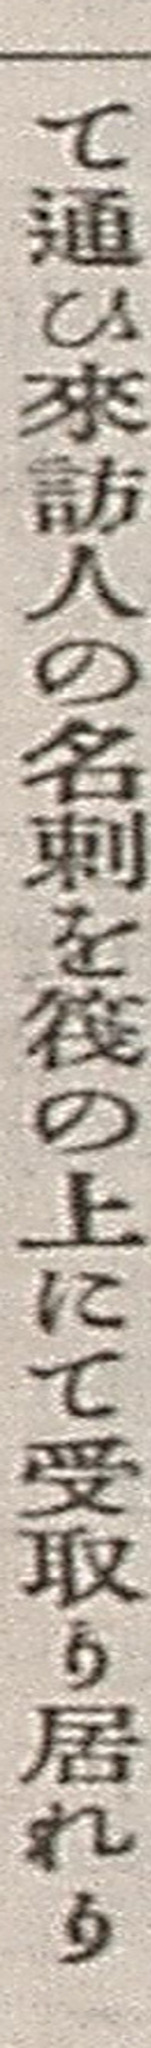て通ひ来訪人の名刺を筏の上にて受取り居れり
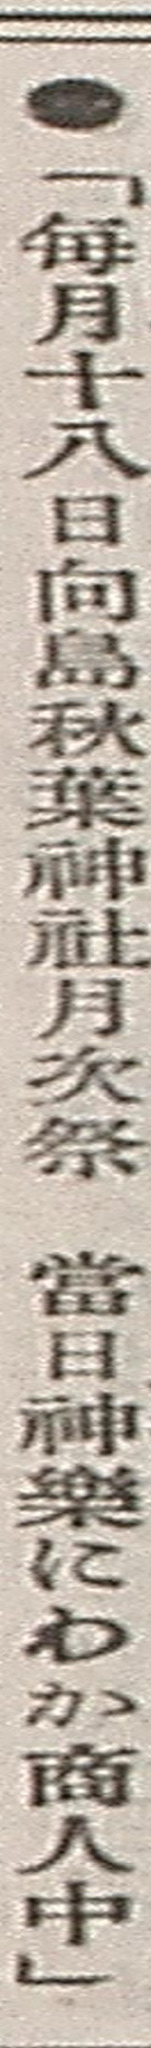●「毎月十八日向島秋葉神社月次祭当日神楽にわか商人中」
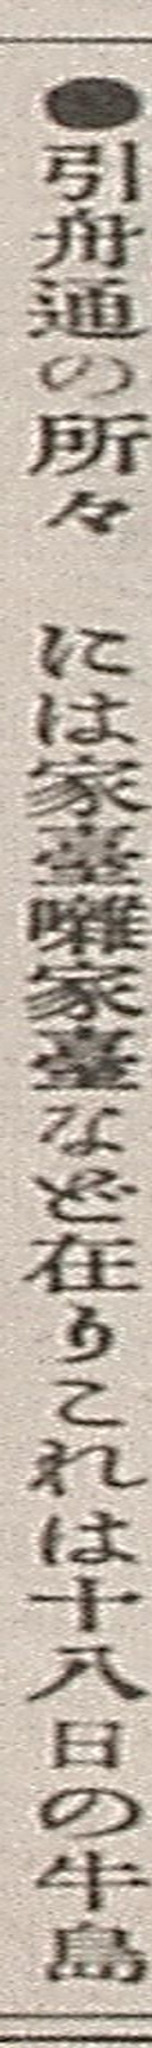●引舟通の所々には屋台囃屋台など在りこれは十八日の牛島
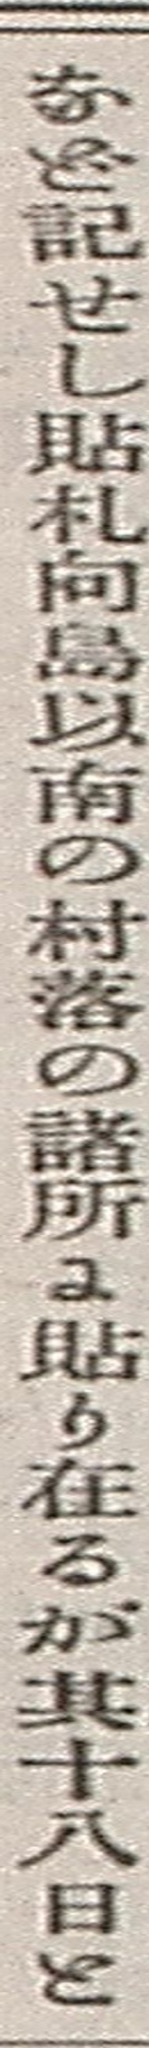など記せし貼札向島以南の村落の諸所に貼り在るが其十八日と
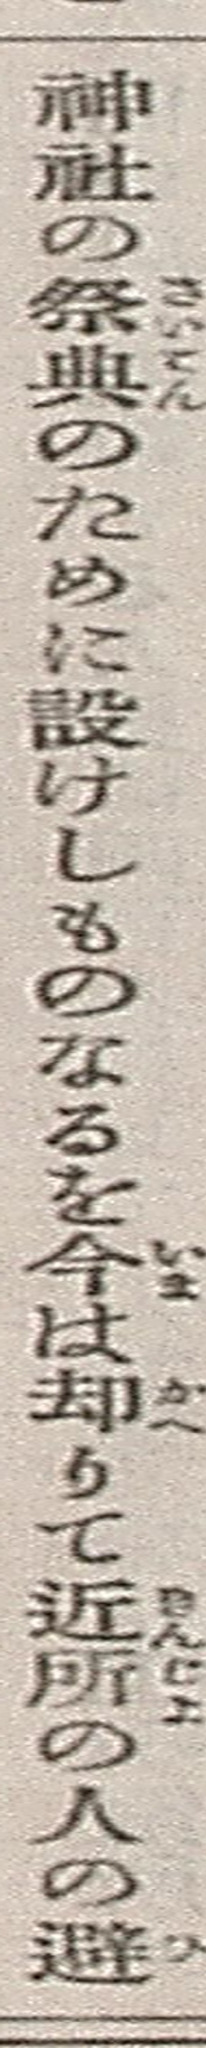神社の祭典のために設けしものなるを今は却りて近所の人の避
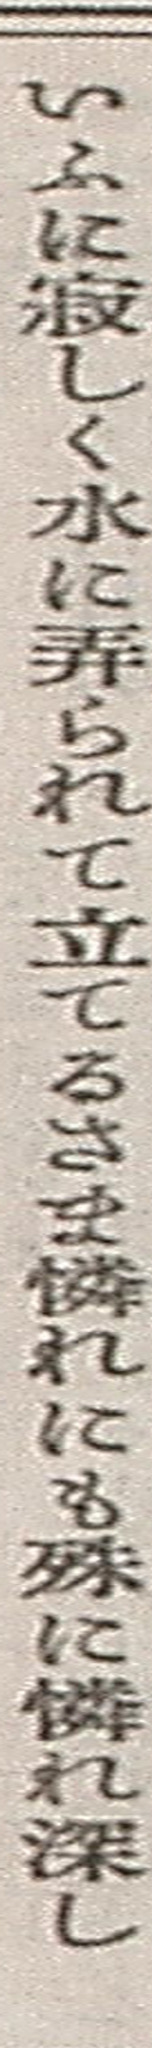いふに寂しく水に弄られて立てるさまは憐れにも殊に憐れ深し
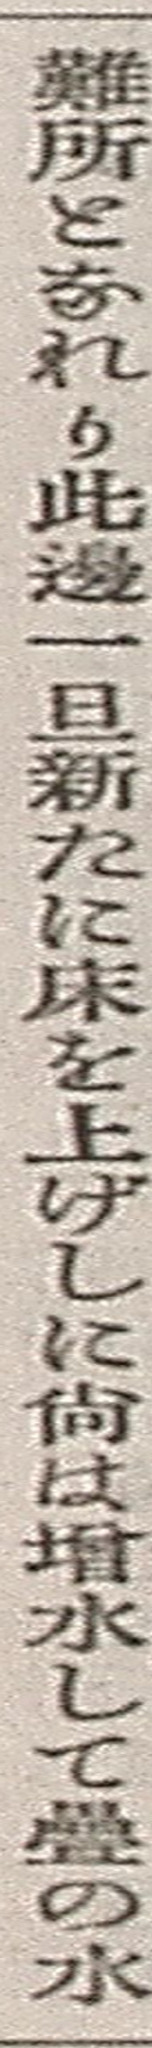難所となれり此辺一旦新たに床を上げしに尚ほ増水して畳の水
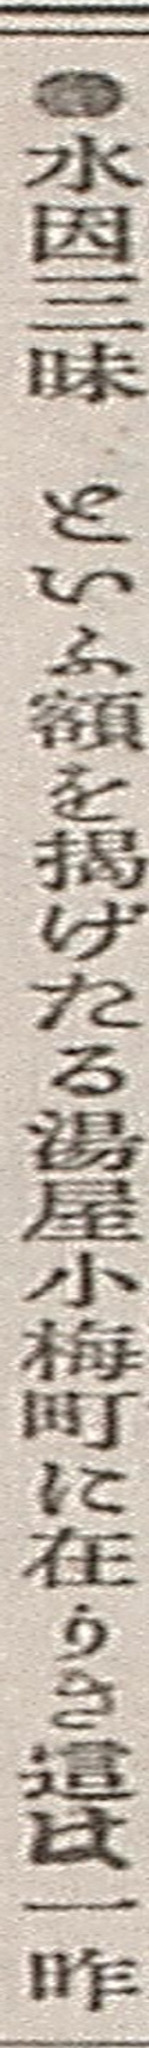●水因三昧といふ額を掲げたる湯屋小梅町に在りき這は一昨
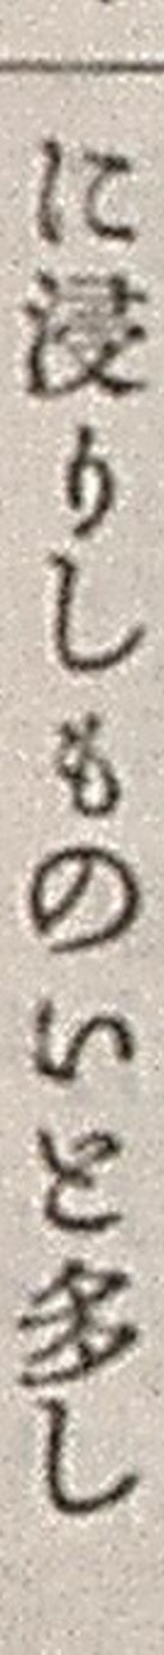に浸りしものいと多し
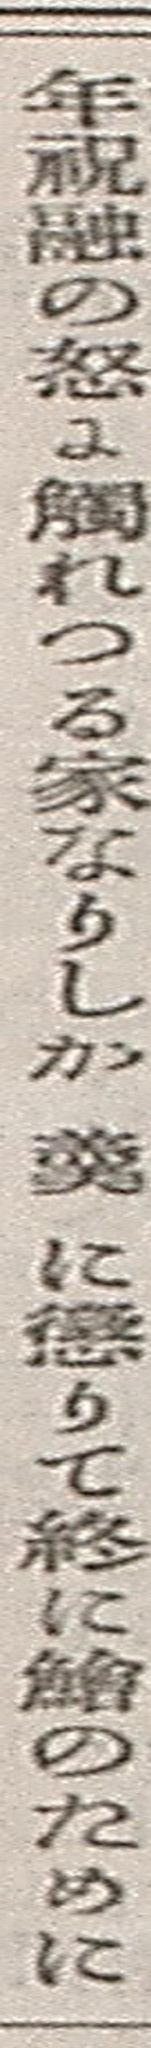年祝融の怒に触れつる家なりしか羹に懲りて終に鱠のために
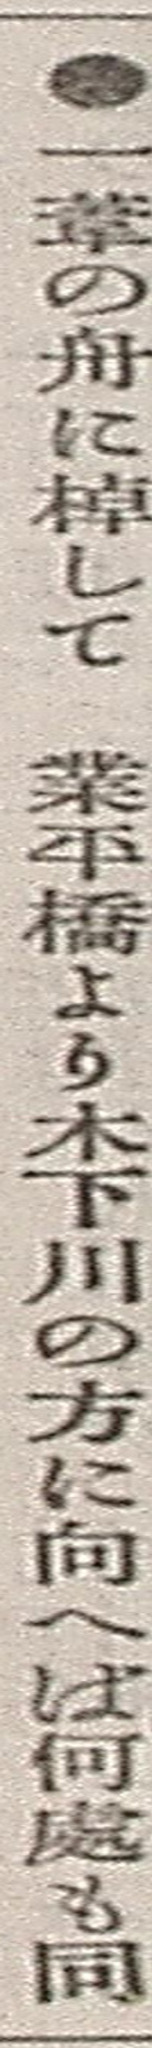●一葦の舟に棹して業平橋より木下川の方に向へば何処も同
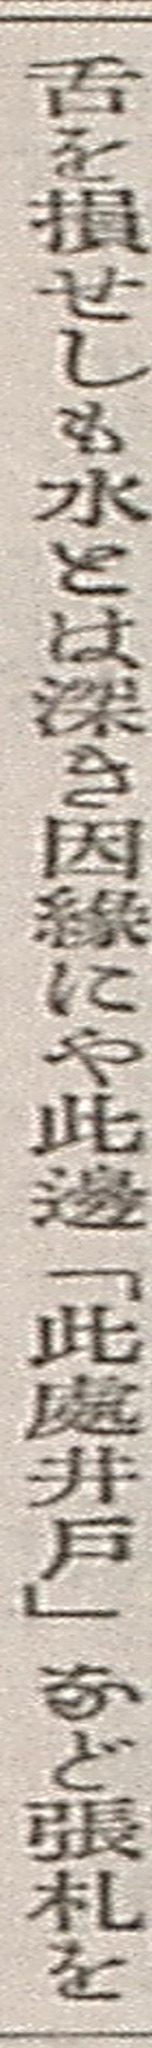舌を損せしも水とは深き因縁にや此辺「此処井戸」など貼札を
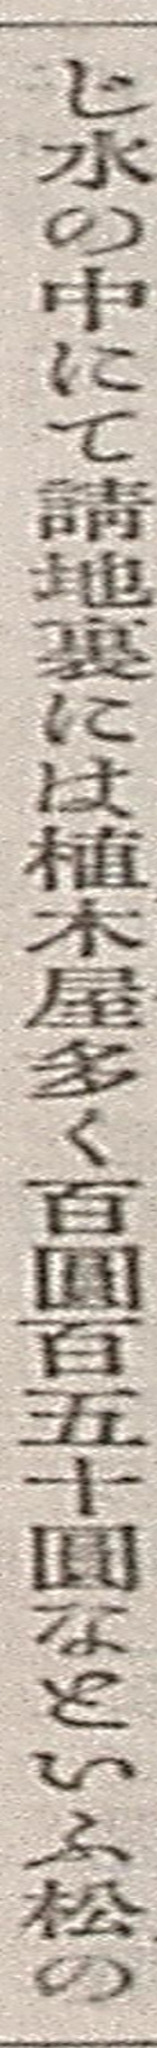じ水の中にて請地裏には植木屋多く百円百五十円なといふ松の
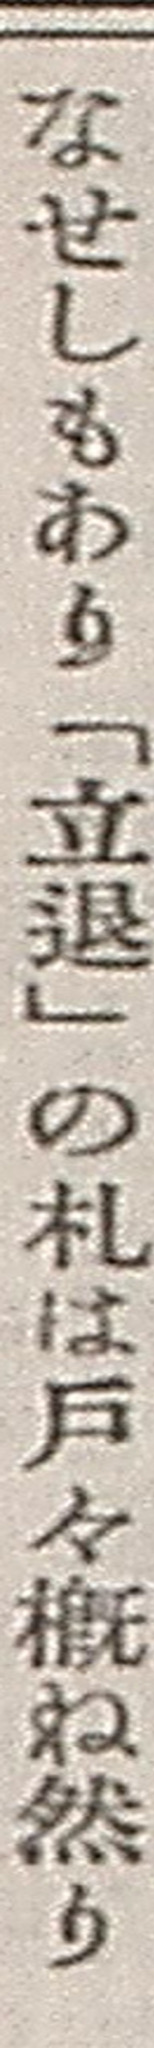なせしもあり「立退」の札は戸々概ね然り
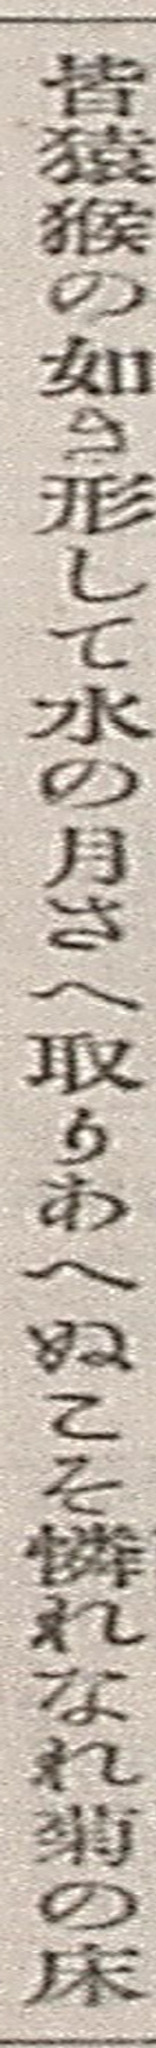皆猿猴の如き形して水の月さへ取りあへぬこそ憐れなれ菊の床
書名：風俗畫報臨時増刊第百二十四號　洪水地震被害録（上）
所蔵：東京大学地震研究所図書室 Earthquake Research Institute Library, The University of Tokyo, JAPAN
